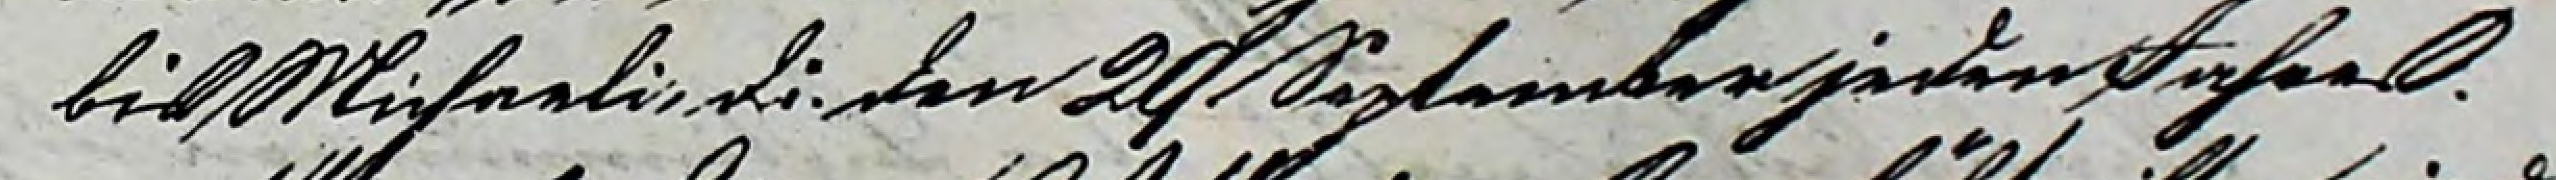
bis Michaeli, di. den 29 September jeden Jahres.
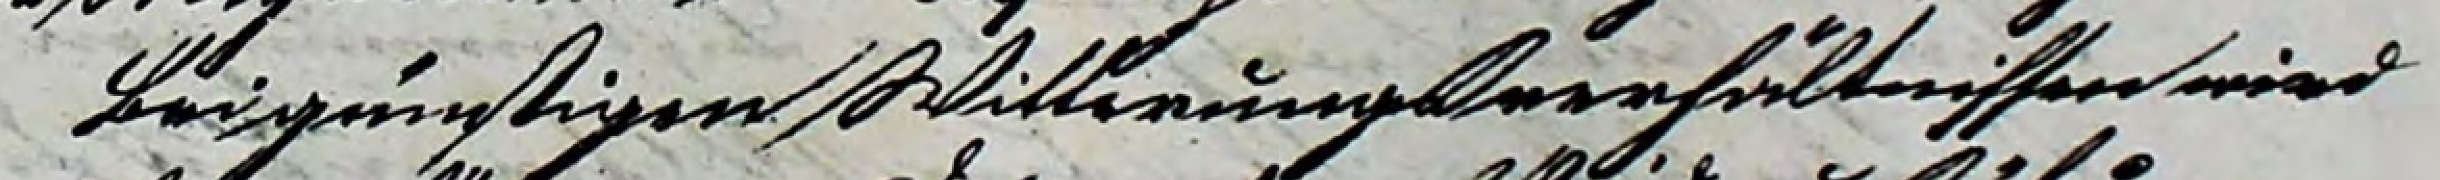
Bei günstigen Witterungsverhältnissen wird
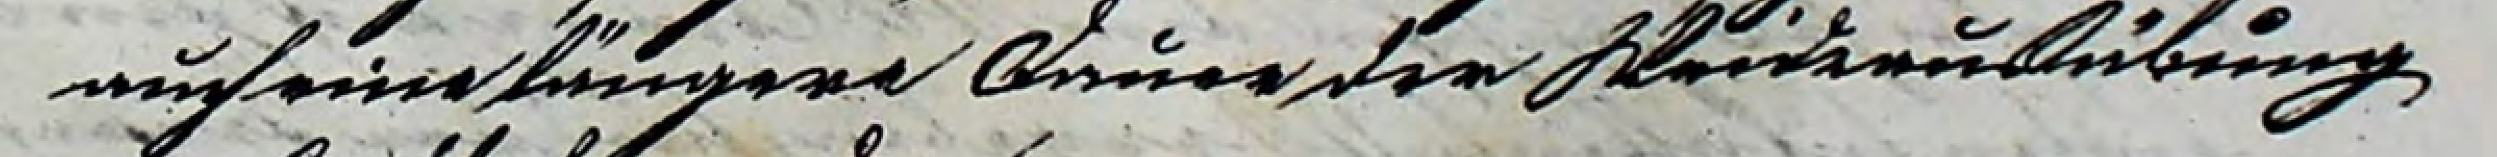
auch eine längere Dauer der Weideausübung
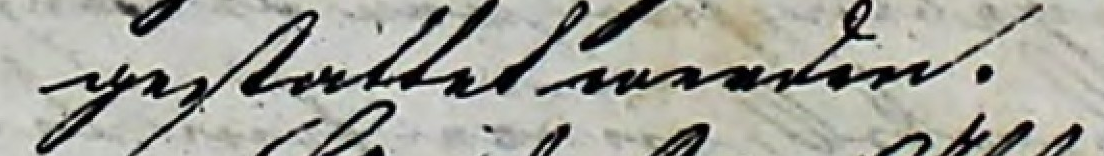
gestattet werden.
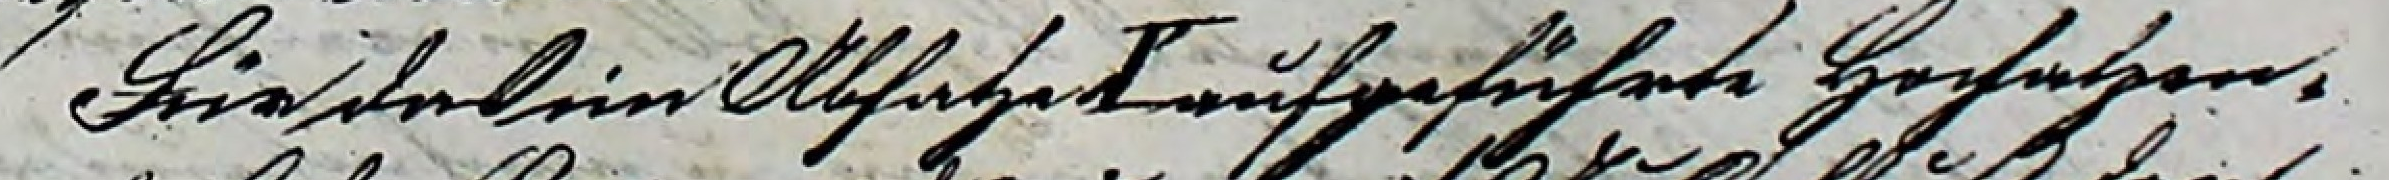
Für das im Absatze X aufgeführte Hochatzen„
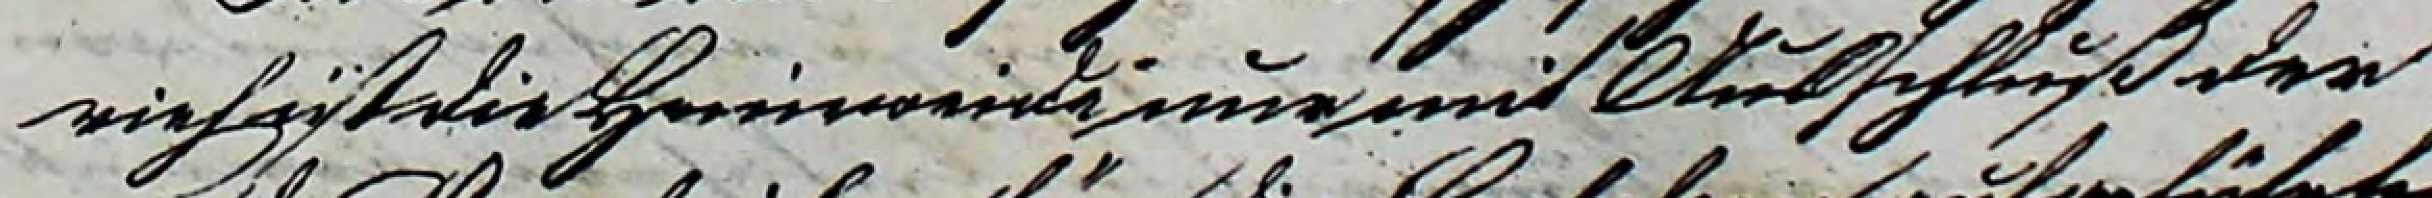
vieh ist die Heimweide nur mit Ausschluß der
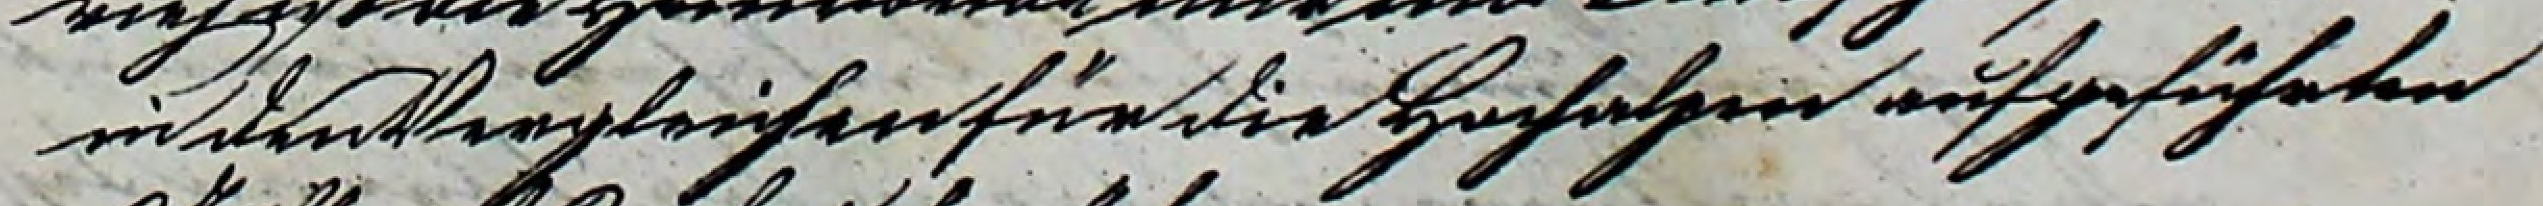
in den Vergleichen für die Hochatzen aufgeführten
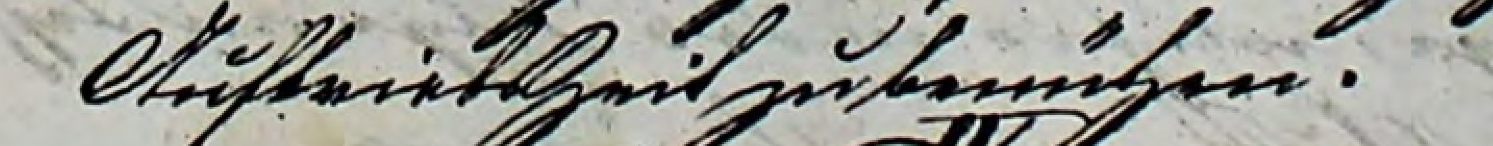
Auftriebszeit zu benützen.
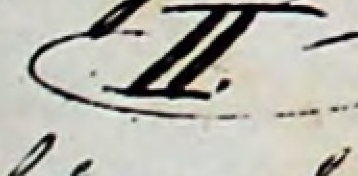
II.
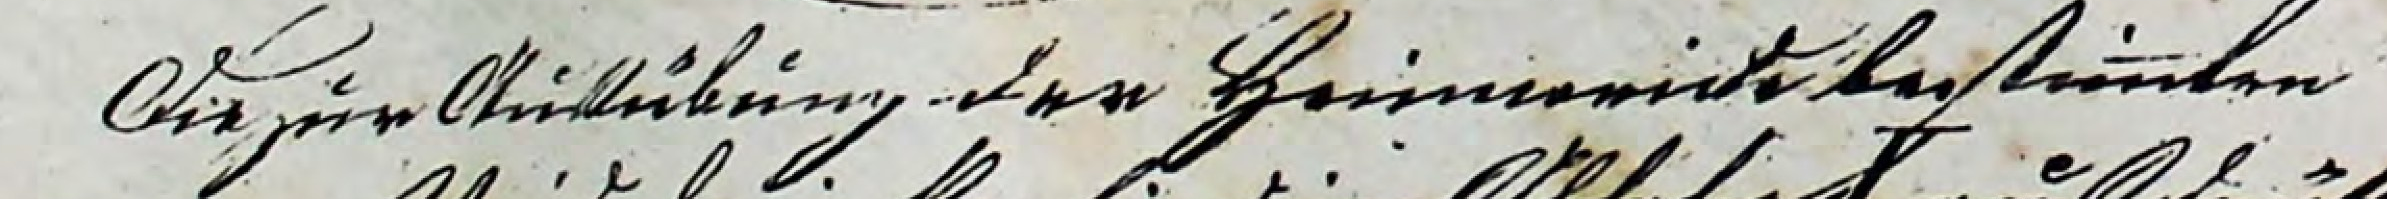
Die zur Ausübung der Heimweide bestimmten
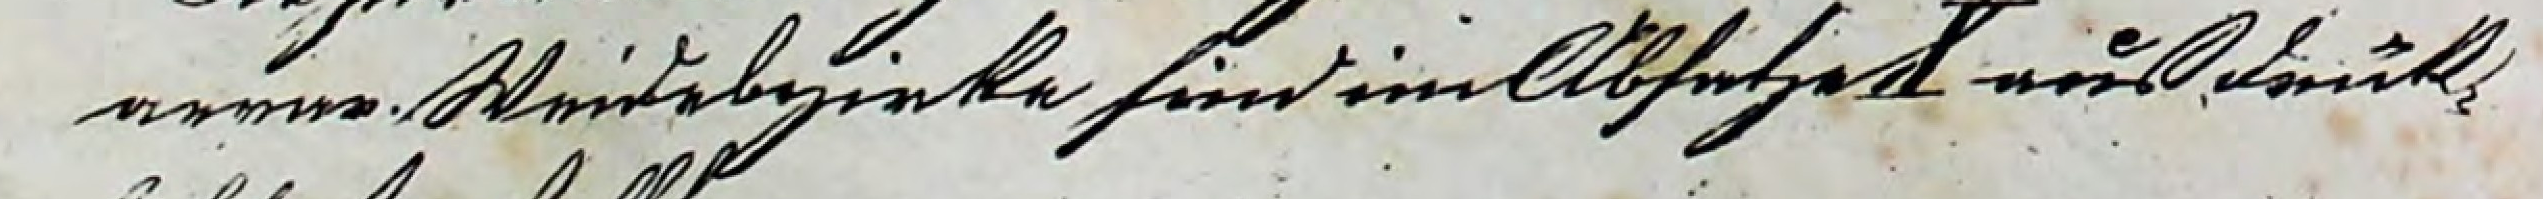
aerar. Weidebezirke sind im Absatze X ausdrück„
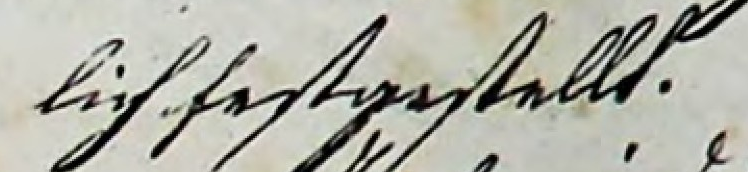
lich festgestellt.
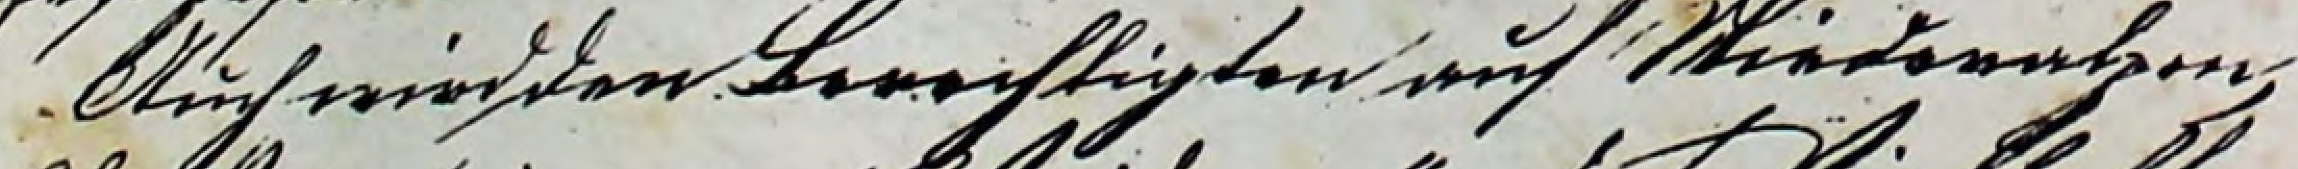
Auch wird den Berechtigten auf Miederatzen
